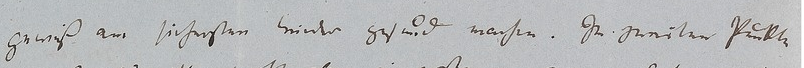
gewiß am sichersten wieder gesund machen. Im zweiten Punkte
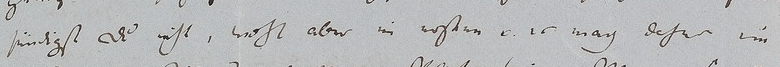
sündigst Du nicht, wohl aber im ersten &. es mag daher ein
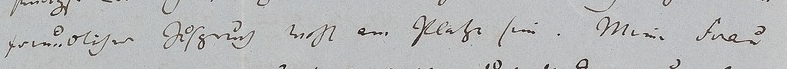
freundlicher Zuspruch wohl am Platze sein. Meine Frau
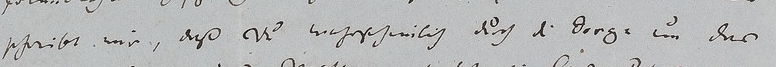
schreibt mir, daß Du wahrscheinlich durch die Sorge um das
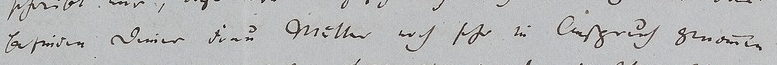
Befinden Deiner Frau Mutter noch sehr in Anspruch genommen
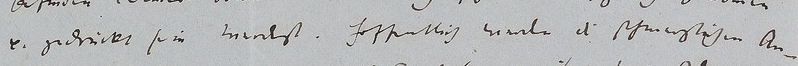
&. gedrückt sein werdest. Hoffentlich werden die schmerzlichen An-
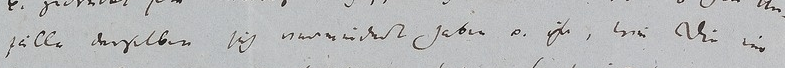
fälle derselben sich vermindert haben &. ihr, wie Dir ein
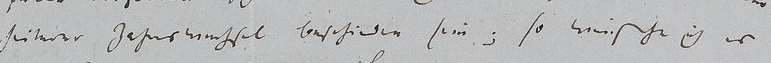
heiterer Jahreswechsel beschieden sein; so wünsche ich es
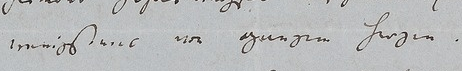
wenigstens von ganzem Herzen.
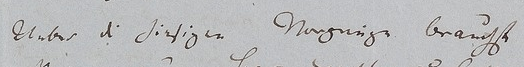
Ueber die hiesigen Vorgänge brauchst
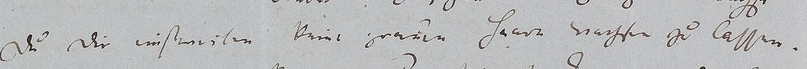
Du Dir einstweilen keine grauen Haare wachsen zu lassen.
